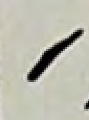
1
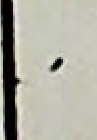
,
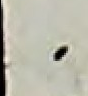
,
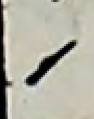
1
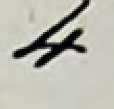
4
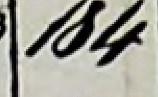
184
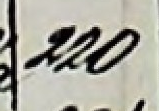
220
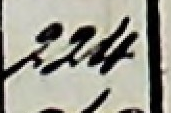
224
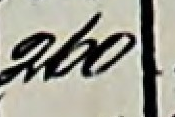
260
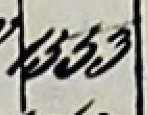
1553
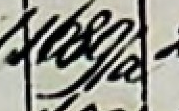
1689/a
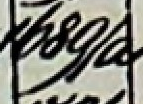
1689/a
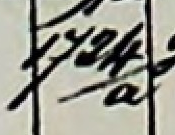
1724/a
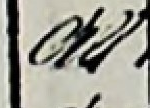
Alt
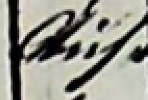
Aus„
